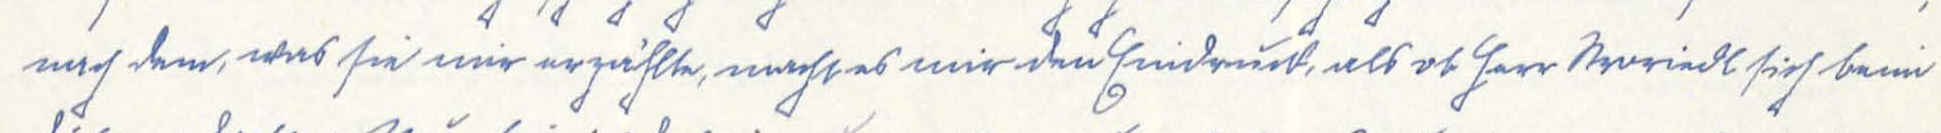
nach dem, was sie mir erzählte, macht es mir den Eindruck, als ob Herr Stroriedl sich beim
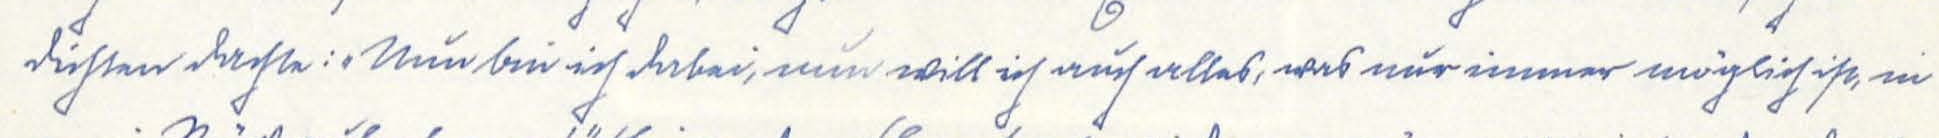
dichten dachte: Nun bin ich dabei, nun will ich auch alles, was nur immer möglich ist in
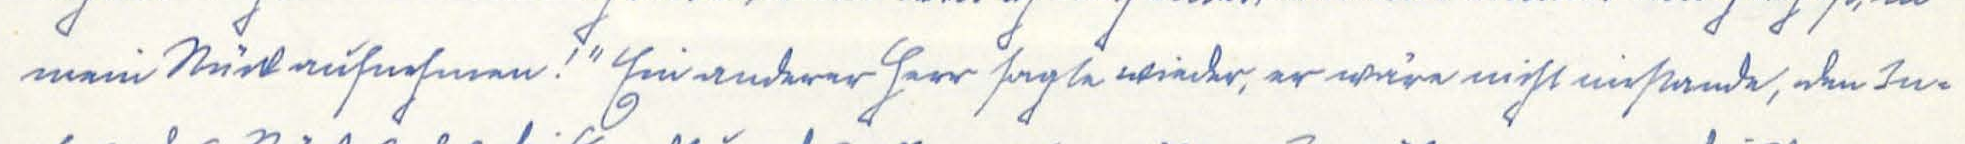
mein Stück aufnehmen!" Ein anderer Herr sagte wieder, er wäre nicht imstande, den In-
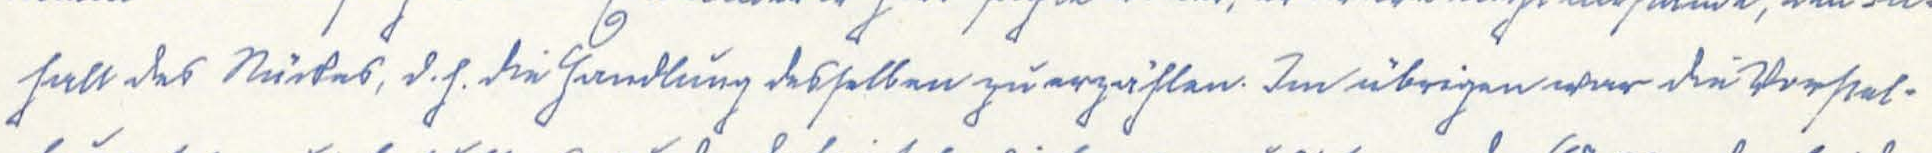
halt des Stückes, d. h. die Handlung desselben zu erzählen. Im übrigen war die Vorstel-
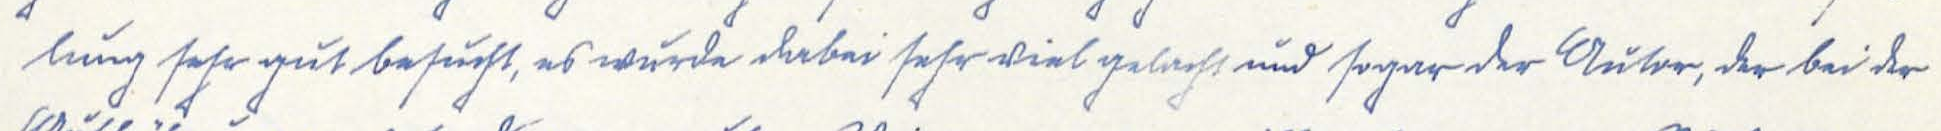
lung sehr gut besucht, es wurde dabei sehr viel gelacht und sogar der Autor, der bei der
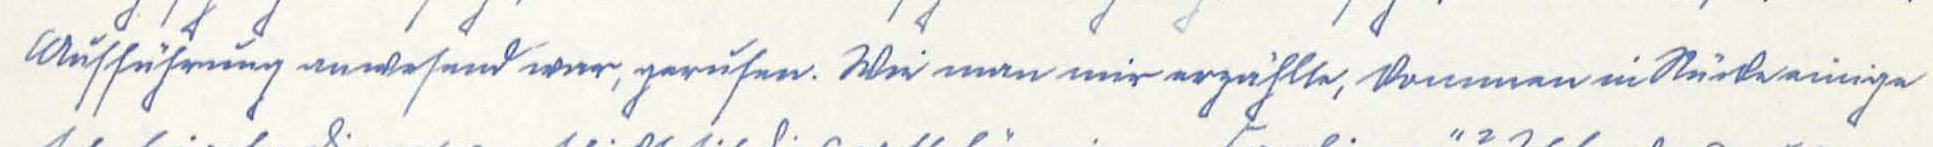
Aufführung anwesend war, gerufen. Wie man mir erzählt, kommen im Stück einige
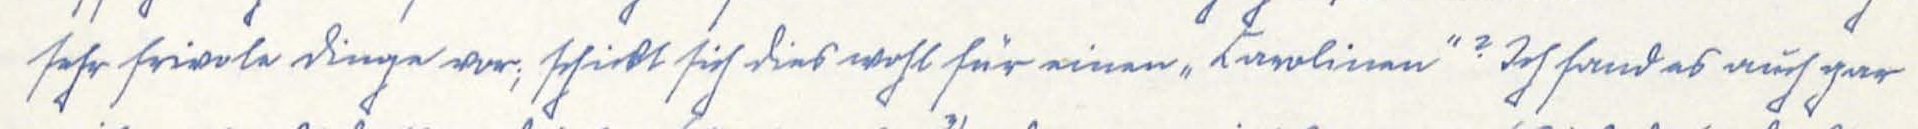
sehr frivole Dinge vor; schickt sich dies wohl für einen "Carolinen" ? Ich fand es auch gar
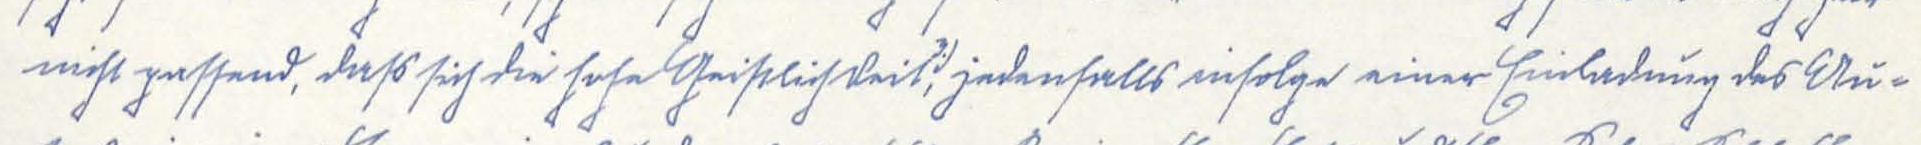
nicht passend, dass sich die hohe Geistlichkeit 3.), jedenfalls infolge einer Einladung des Au-
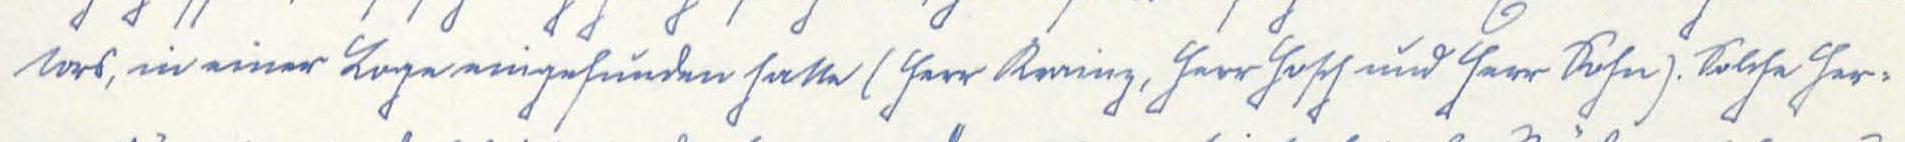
tors, in einer Loge eingefunden hatte (Herr Krainz, Herr Hoch und Herr Sohn). Solche Her-
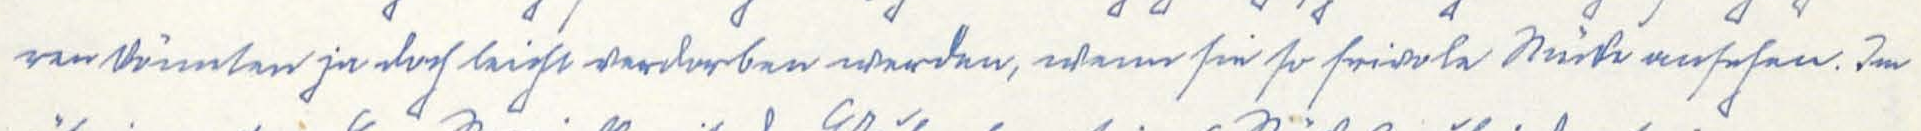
ren könnten ja doch leicht verdorben werden, wenn sie so frivole Stücke ansehen. Im
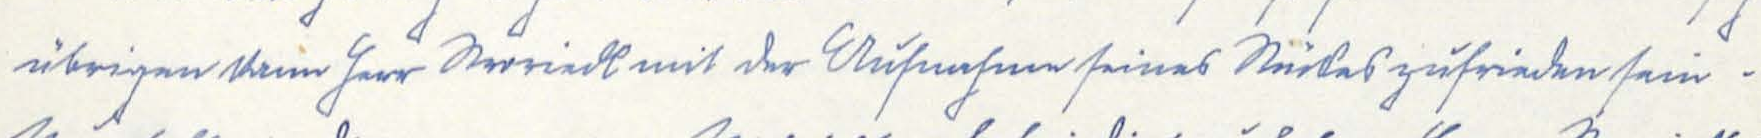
übrigen kann Herr Stroriedl mit der Aufnahme seines Stückes zufrieden sein.
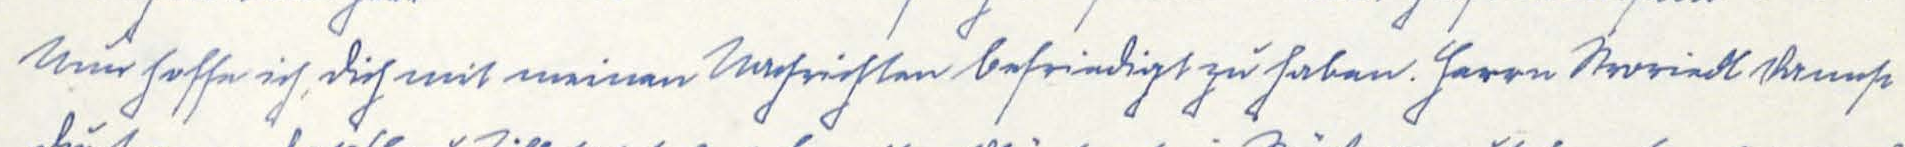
Nun hoffe ich, dich mit meinen Nachrichten befriedigt zu haben. Herrn Stroriedl kannst
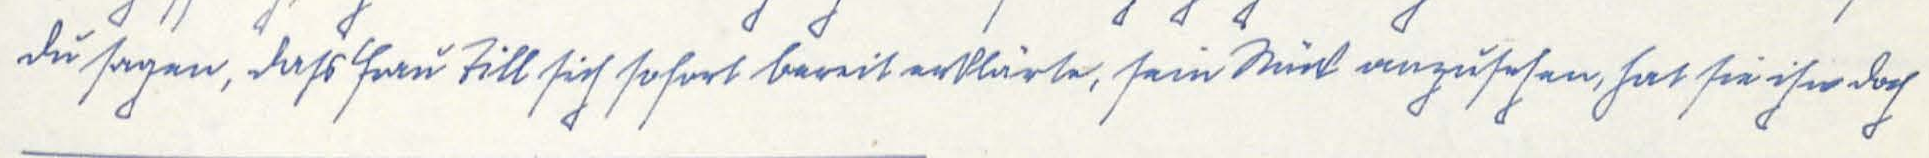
du sagen, dass Frau Till sich sofort bereit erklärte, sein Stück anzusehen hat sie ihn doch
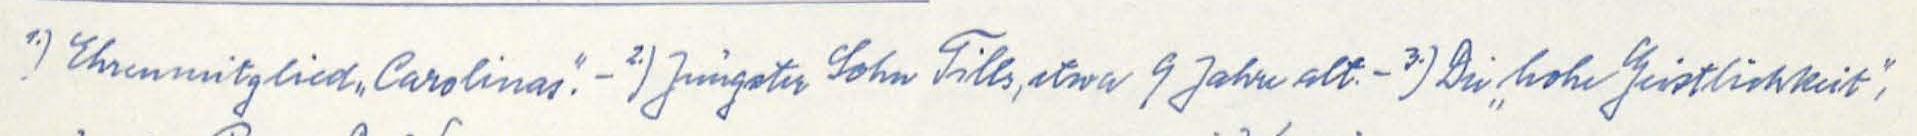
1.) Ehrenmitglied "Carolinas“.- 2.) Jüngster Sohn Tills, etwa 9 Jahre alt.- 3.) Die "hohe Geistlichkeit",
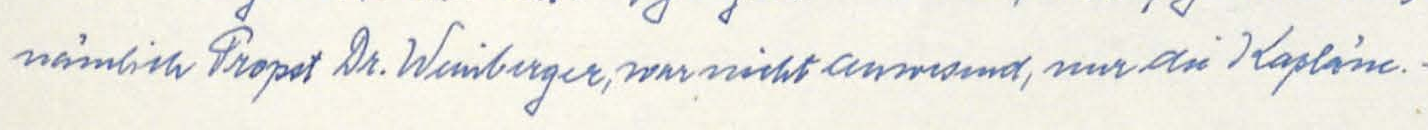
nämlich Propst Dr. Weinberger, war nicht anwesend, nur die Kapläne.-
